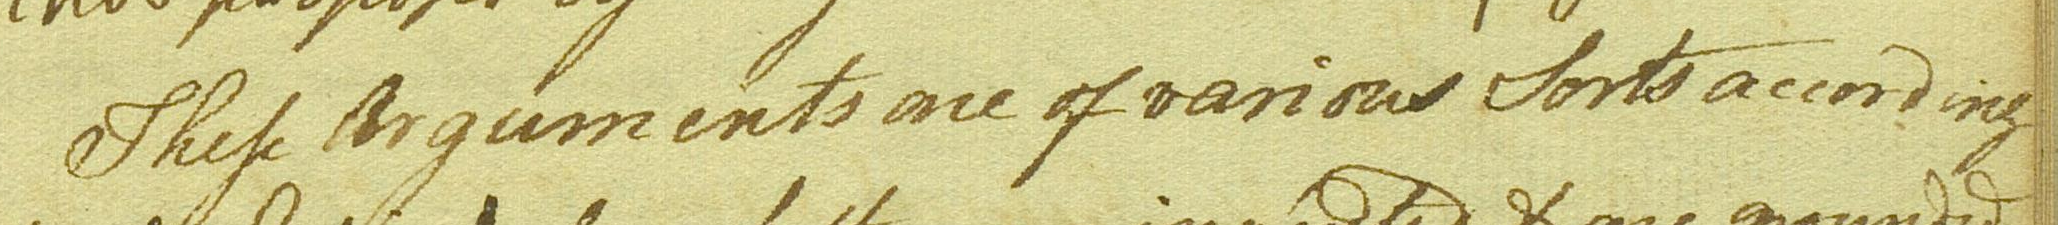These Arguments are of various Sorts according
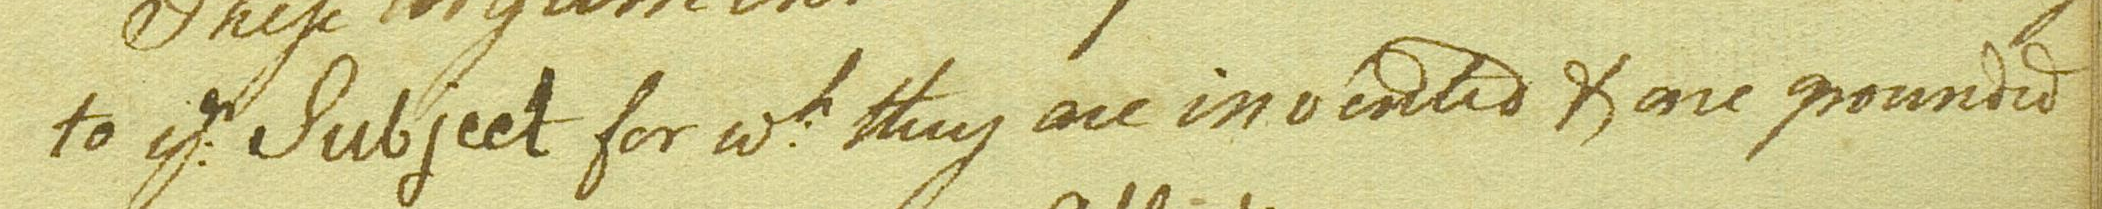to y^e: Subject for w^h: they are invented & are grounded
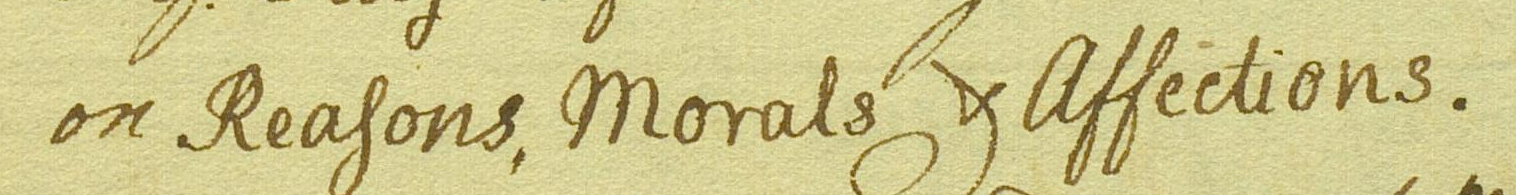on Reasons, Morals & Affections.
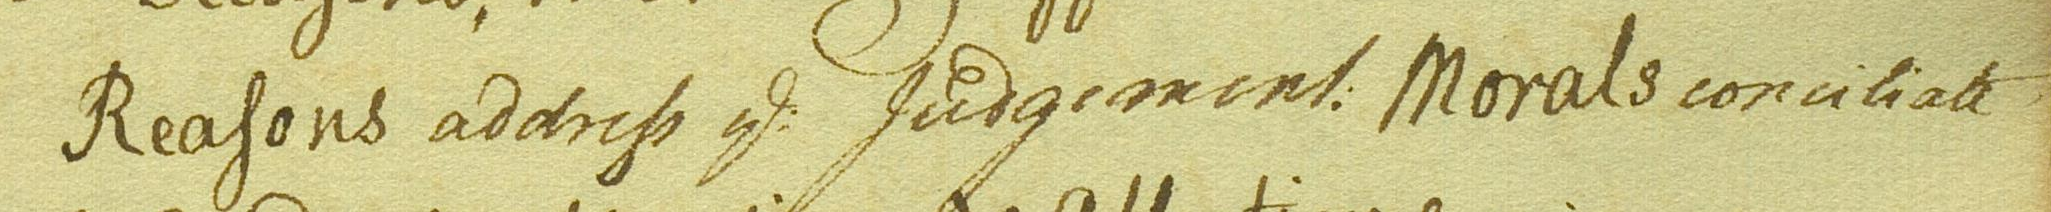Reasons address y^e Judgement, Morals conciliate
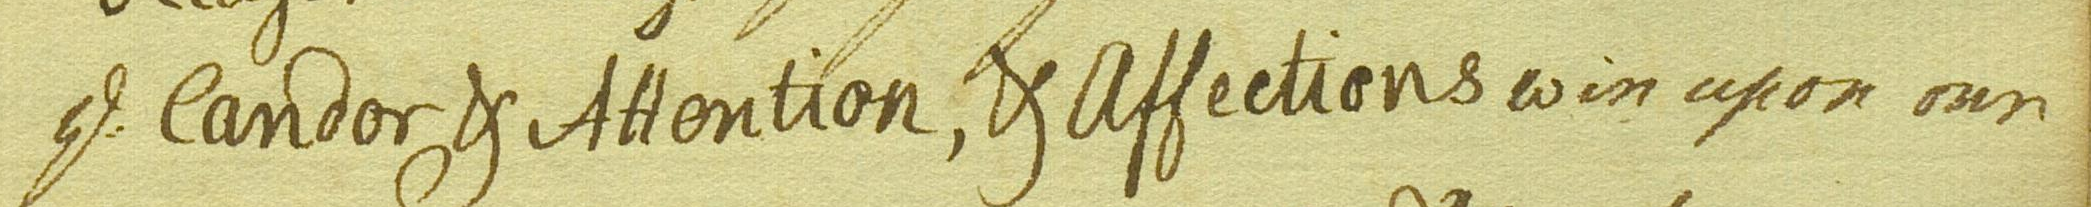y^e: Candor & Attention, & Affections win upon our
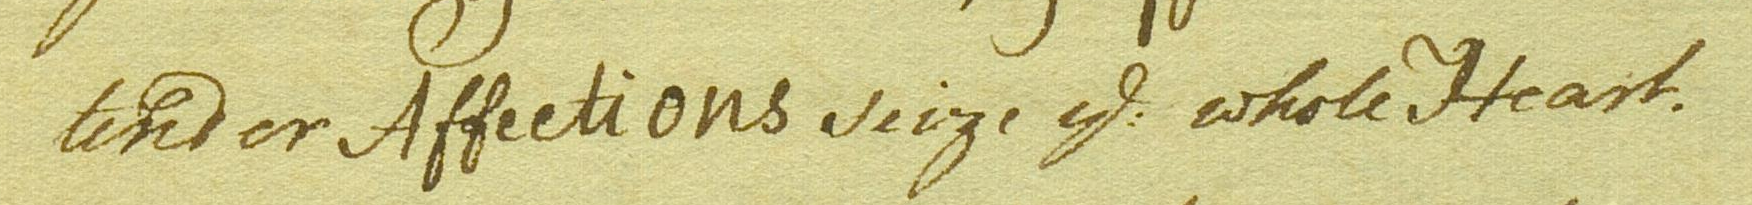tender Affections seize y^e: whole Heart.
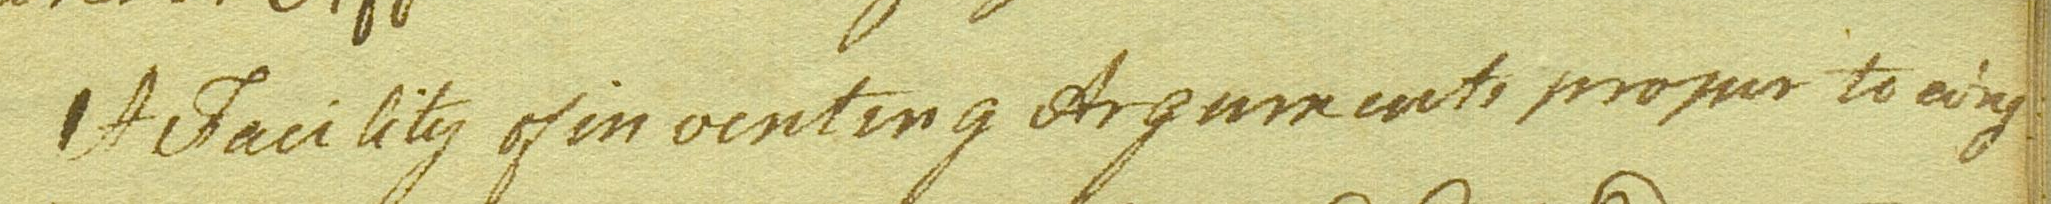A Facility of inventing Arguments proper to any
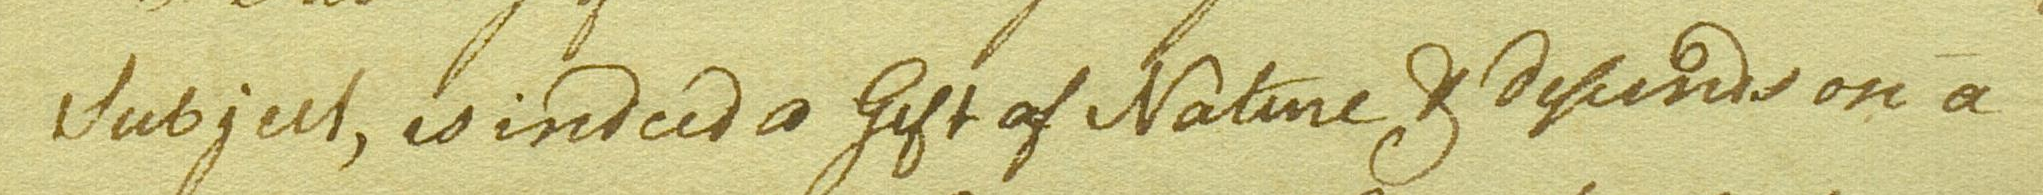Subject, is indeed a Gift of Nature & depends on a
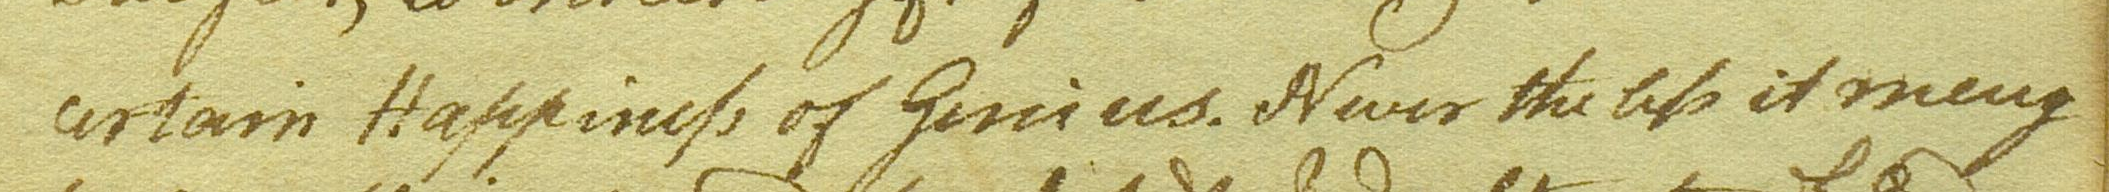certain Happiness of Genius. Never the less it may
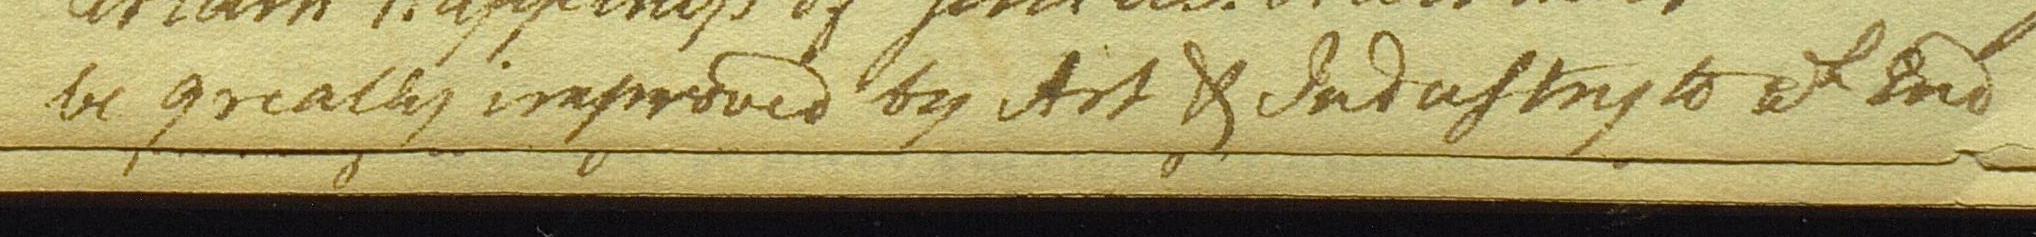be greatly improved by Art & Industry to w^h End
